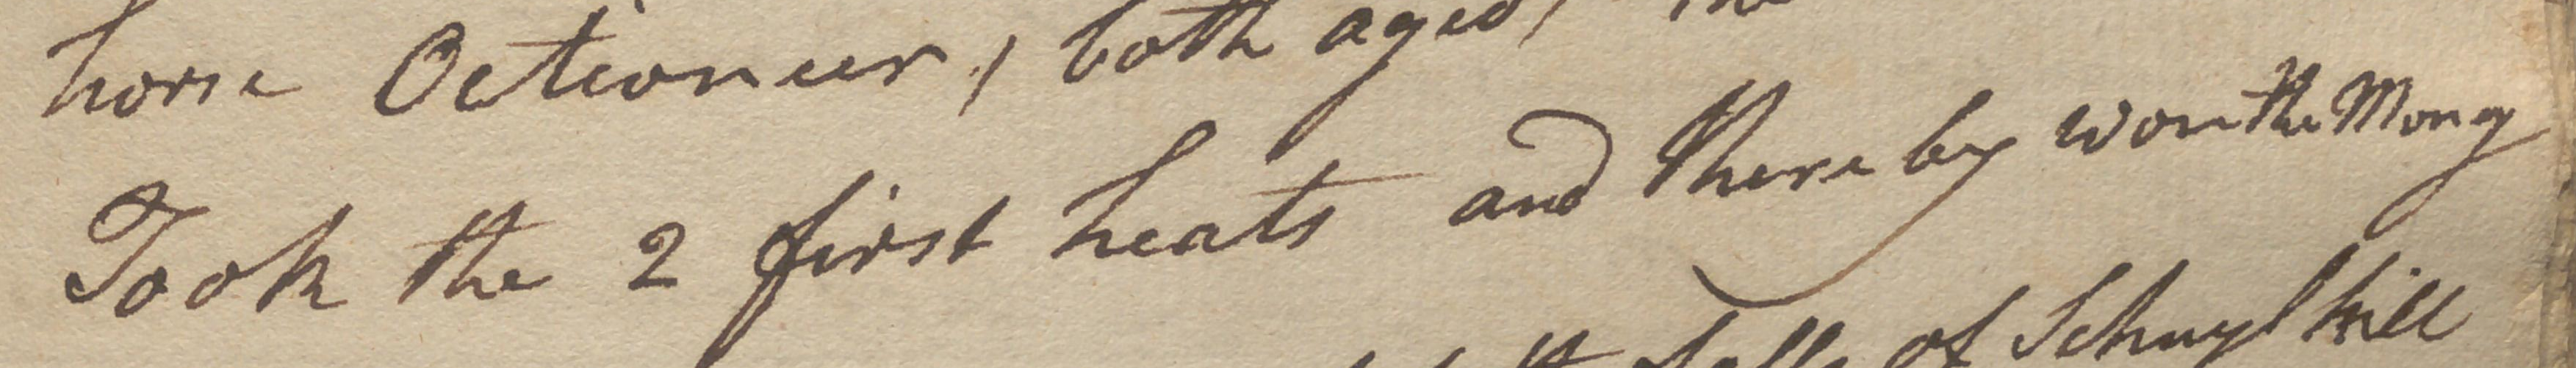Took the 2 first heats and thereby won the Money
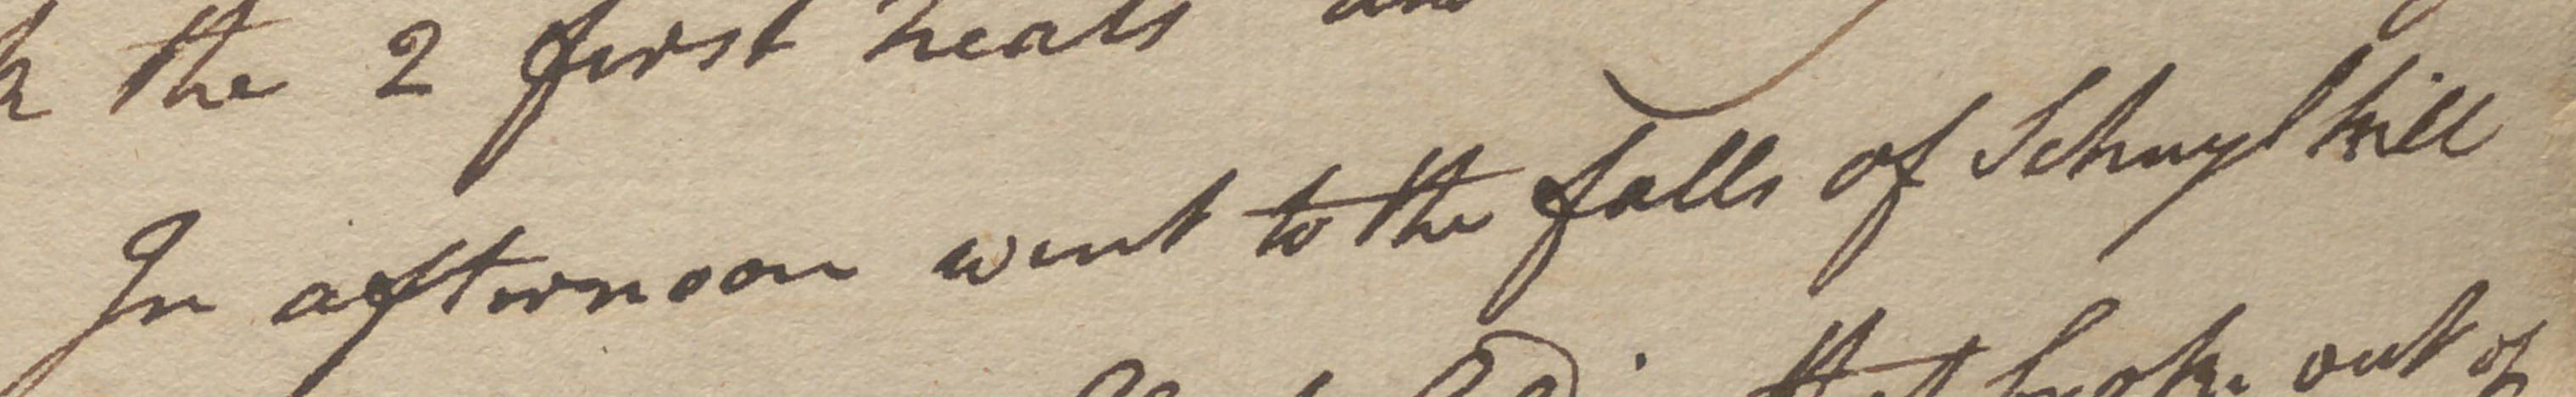In afternoon went to the falls of Schuylkill
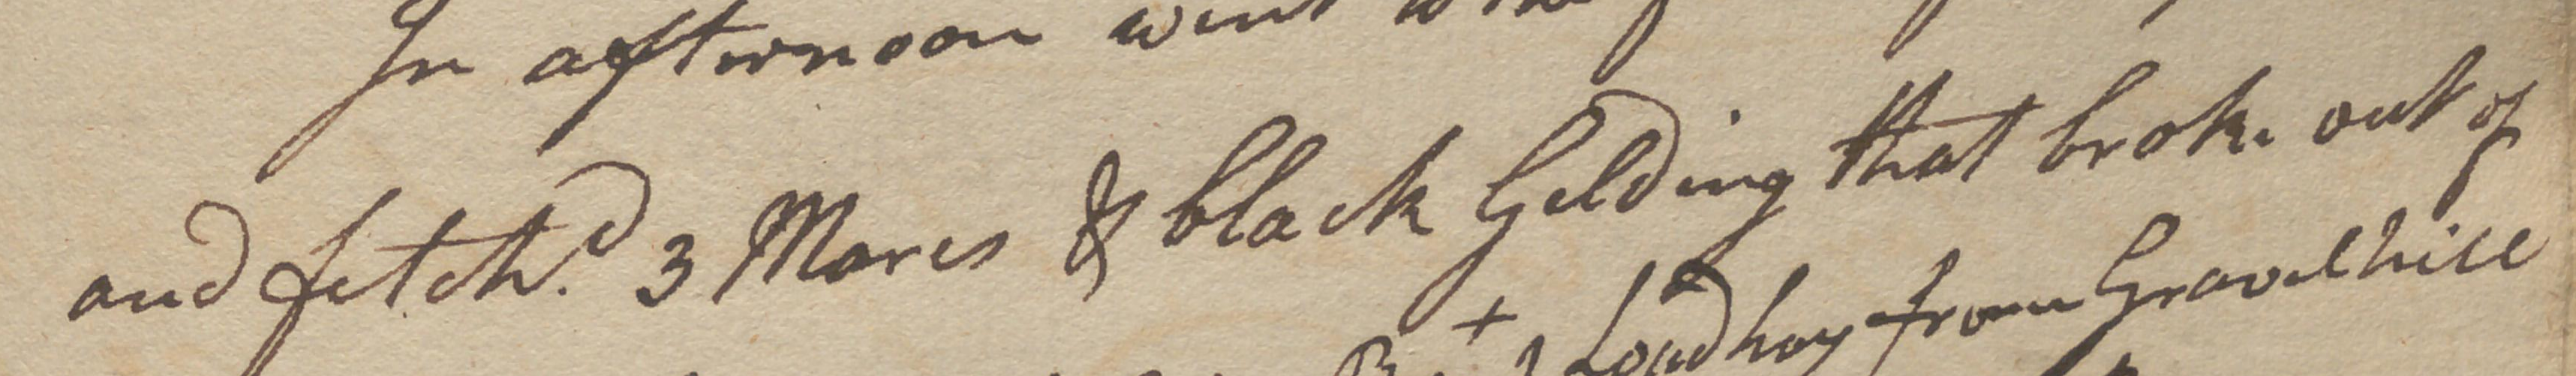and fetch^d. 3 Mares & black Gelding that broke out of
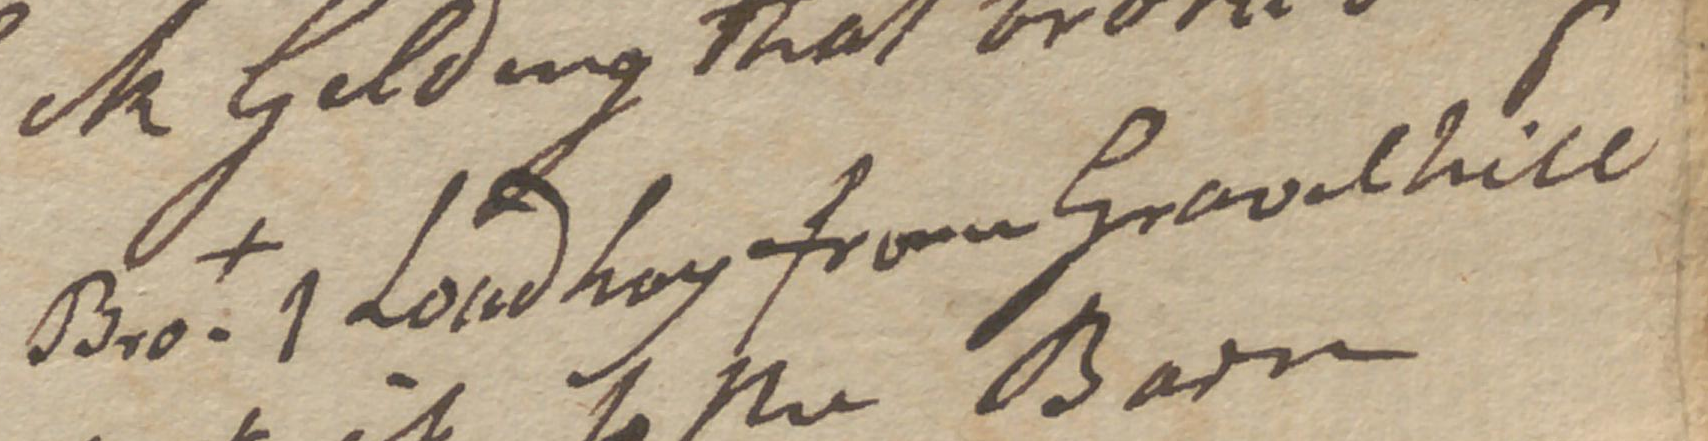Bro^t. 1 Load hay from Gravelhill
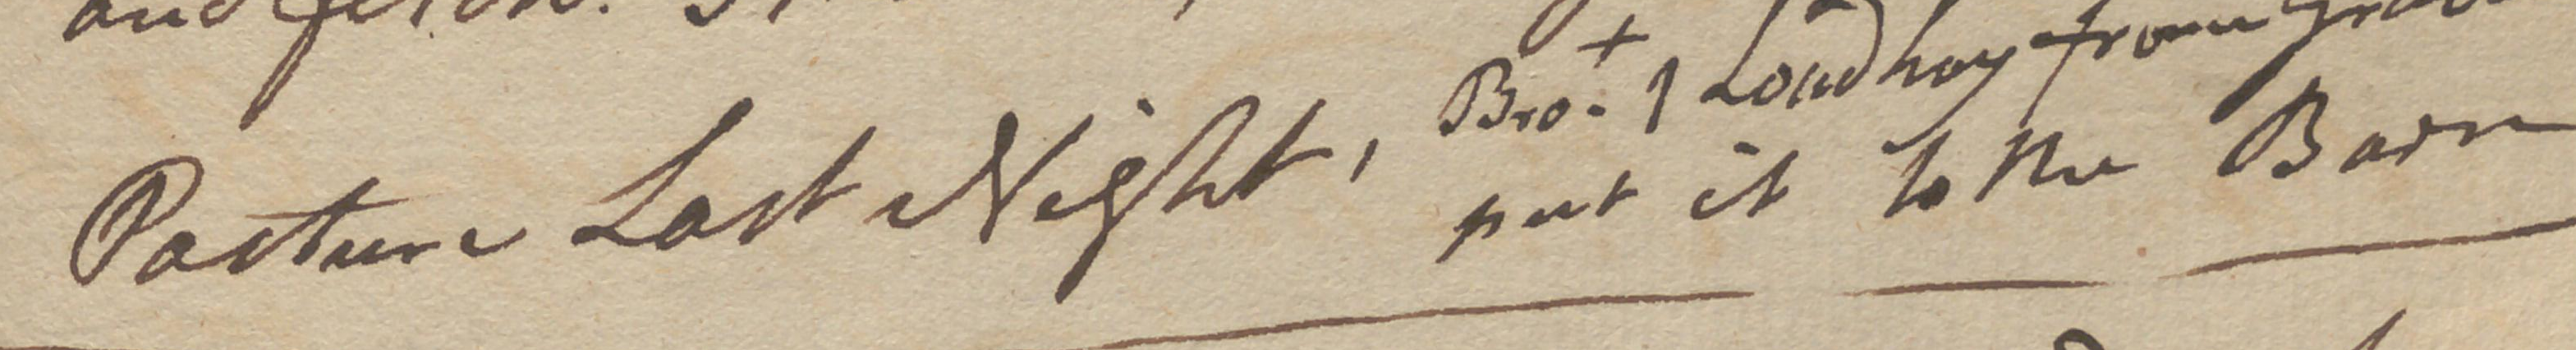Pasture Last Night put it to the Barn
